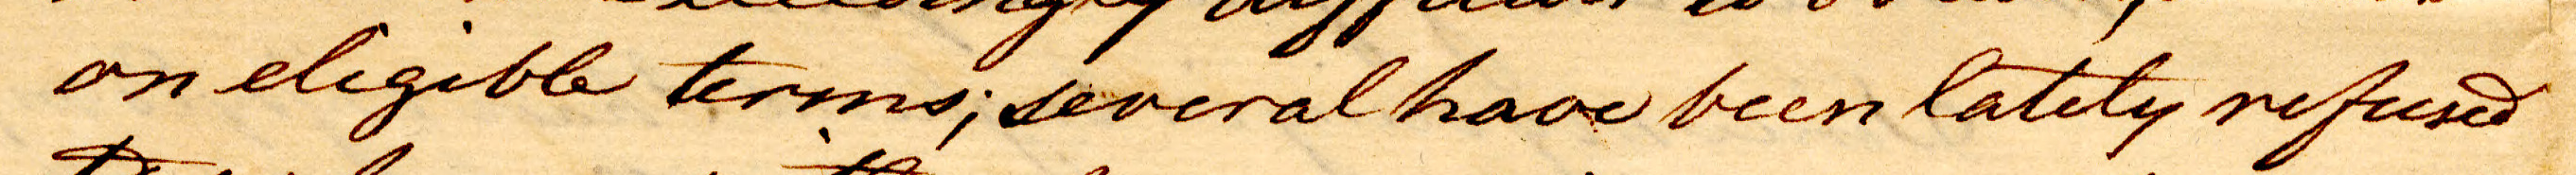on eligible terms; several have been lately refused
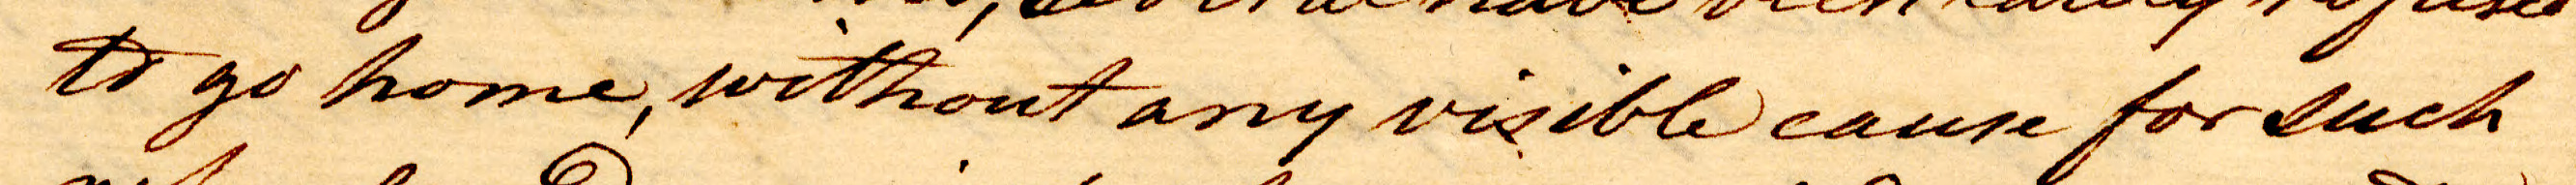to go home, without any visible cause for such
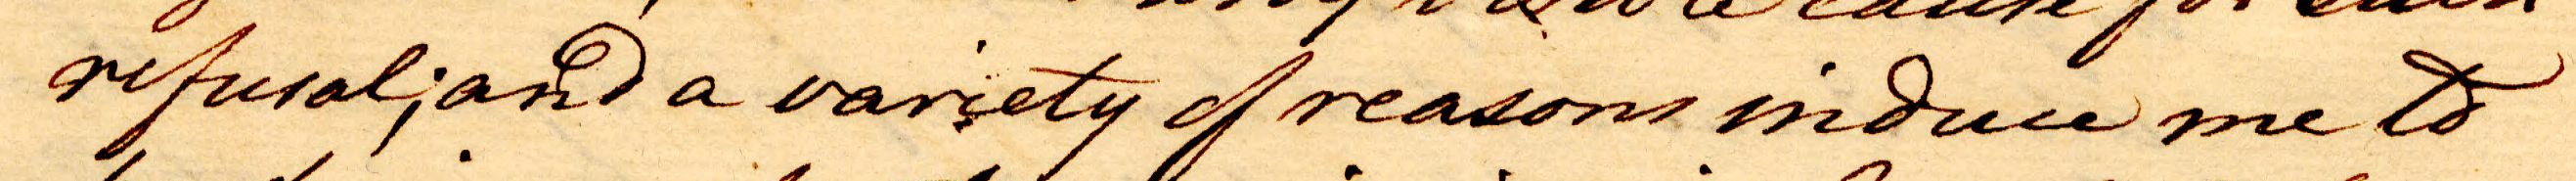refusal; and a variety of reasons induce me to
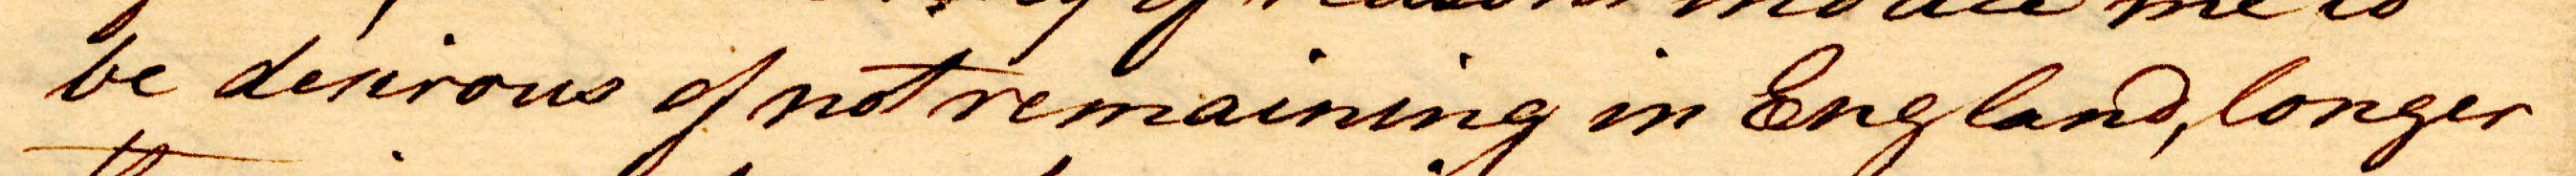be desirous of not remaining in England, longer
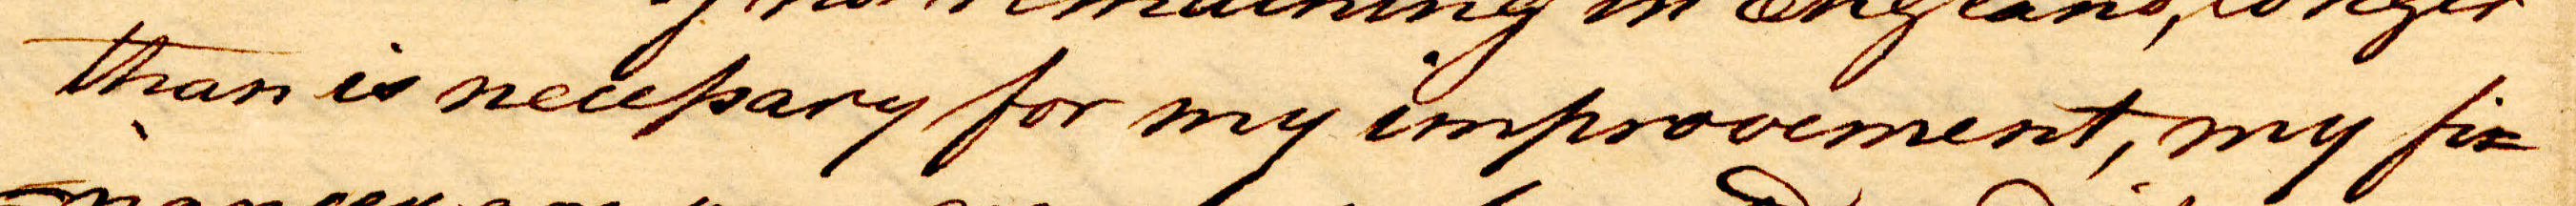than is necessary for my improvement, my fi-
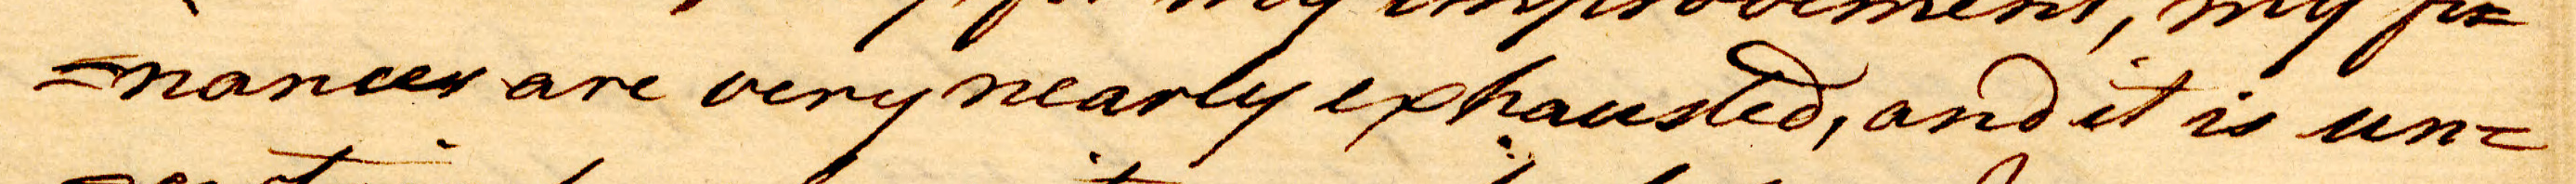-nances are very nearly exhausted, and it is un-
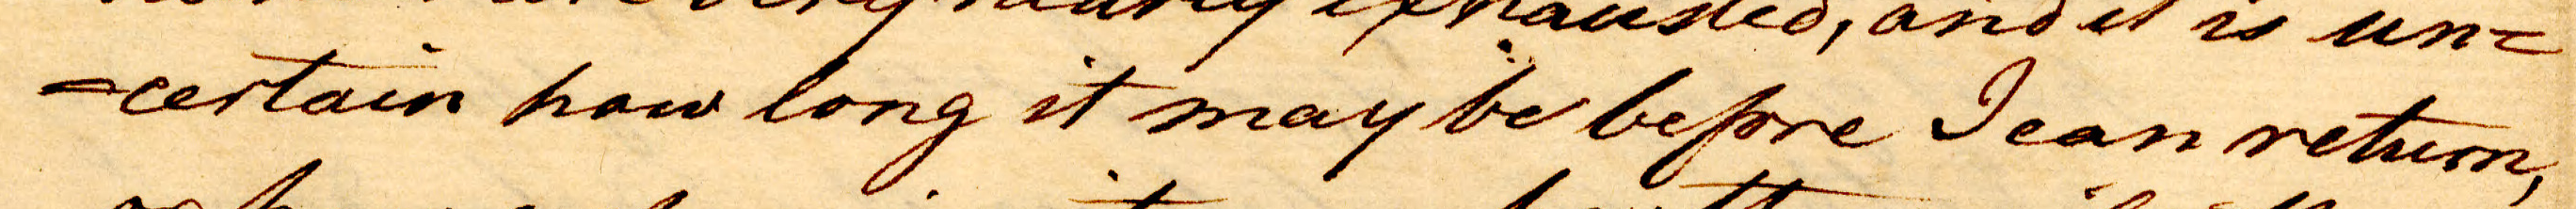-certain how long it may be before I can return,
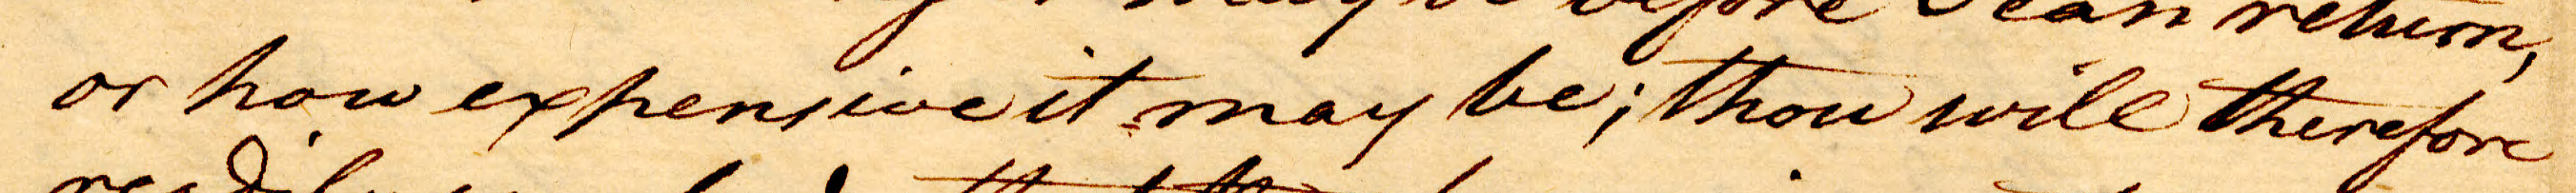or how expensive it may be; thou will therefore
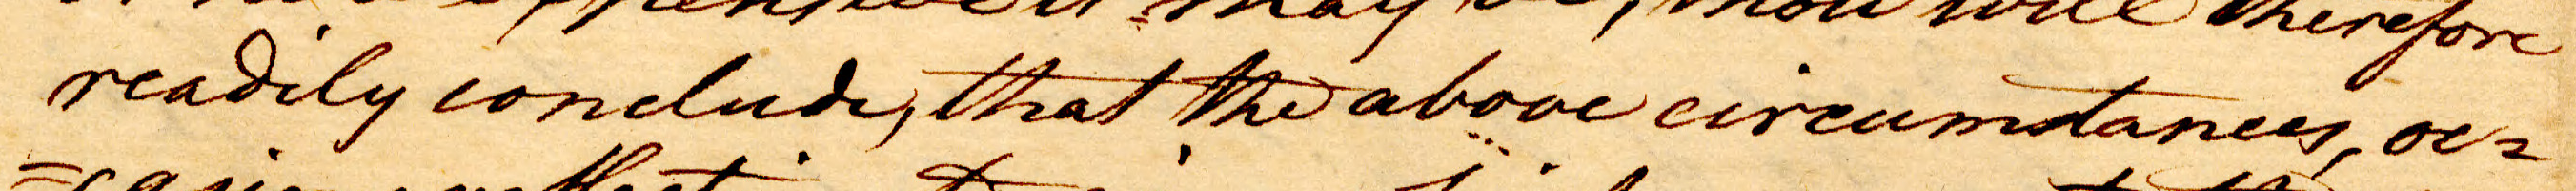readily conclude, that the above circumstances, oc-
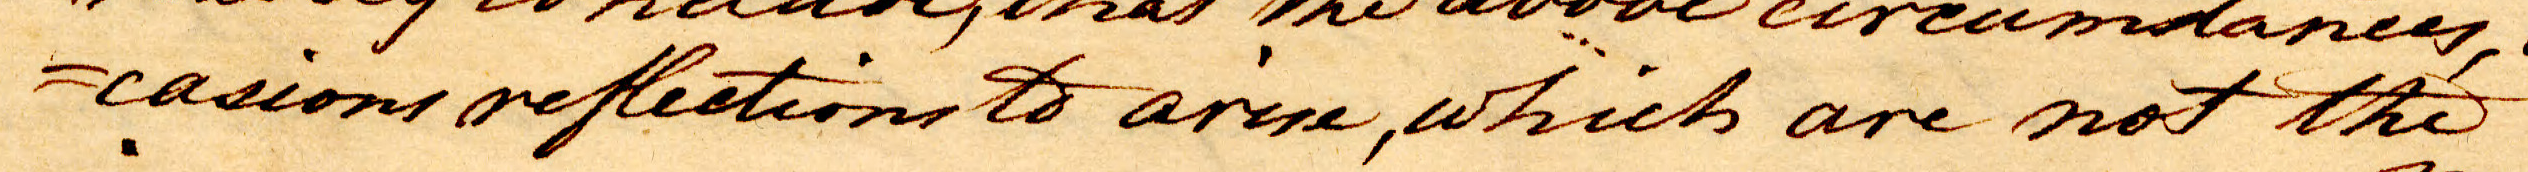-csions reflections to arise, which are not the
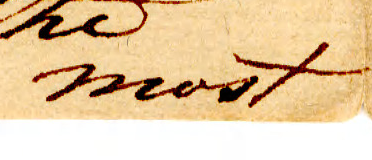most
